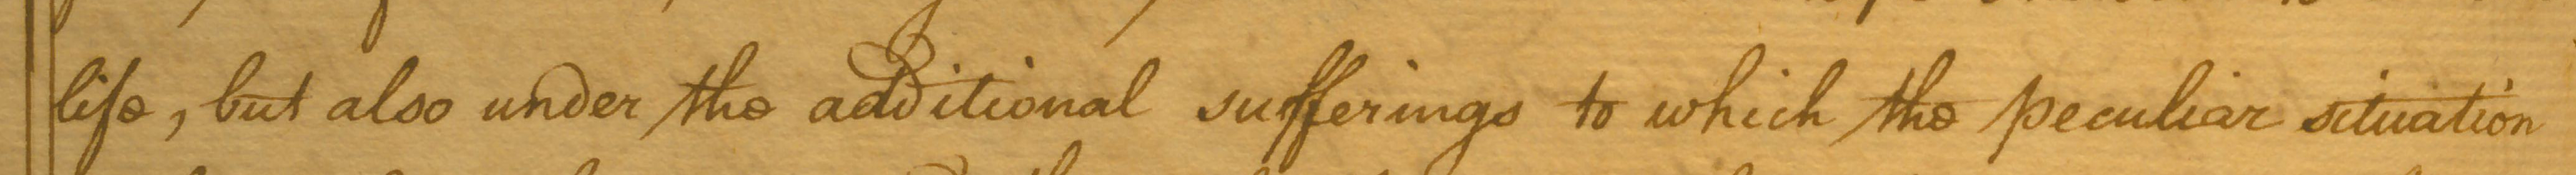life, but also under the additional sufferings to which the peculiar situation
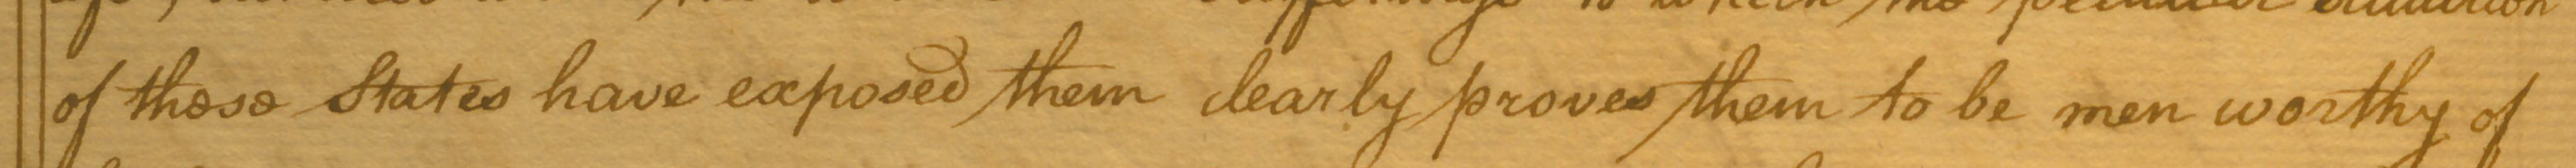of these States have exposed them clearly proves them to be men worthy of
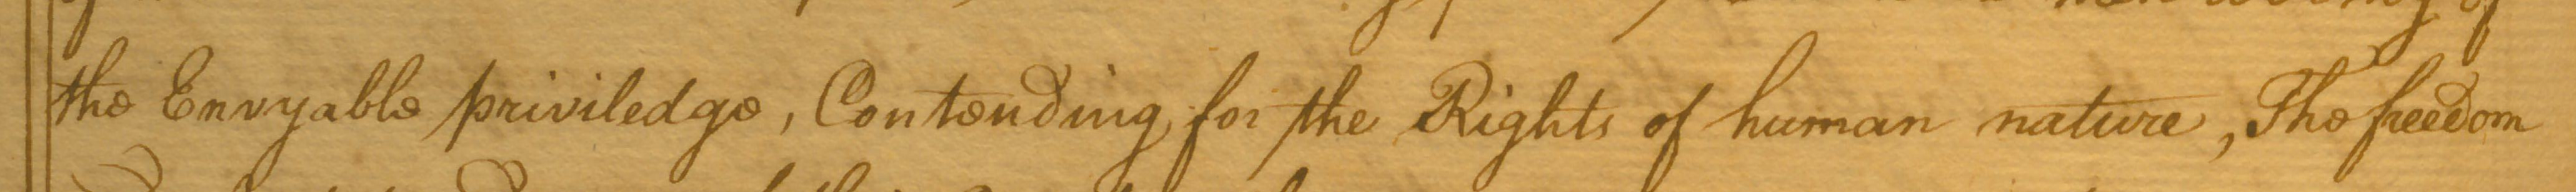the Envyable priviledge, Contending for the Rights of human nature, The freedom
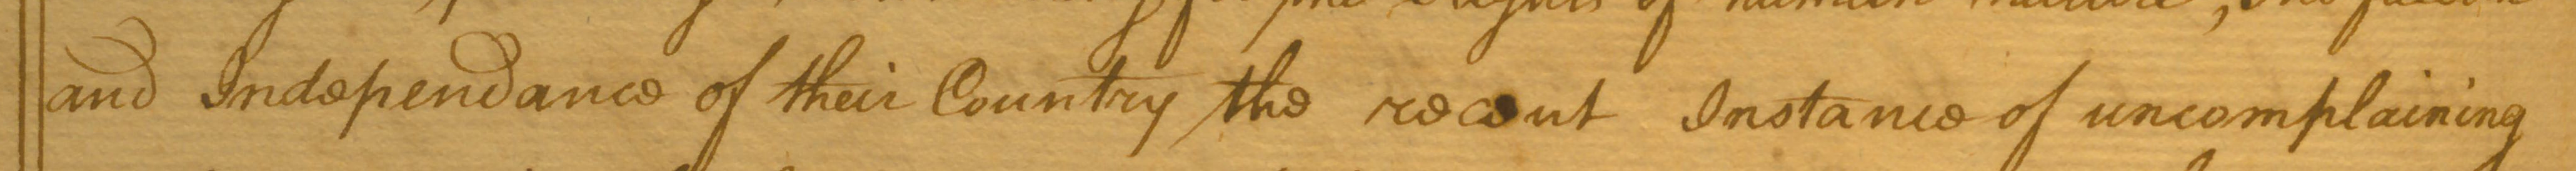and Independence of their Country the recent Instance of uncomplaining
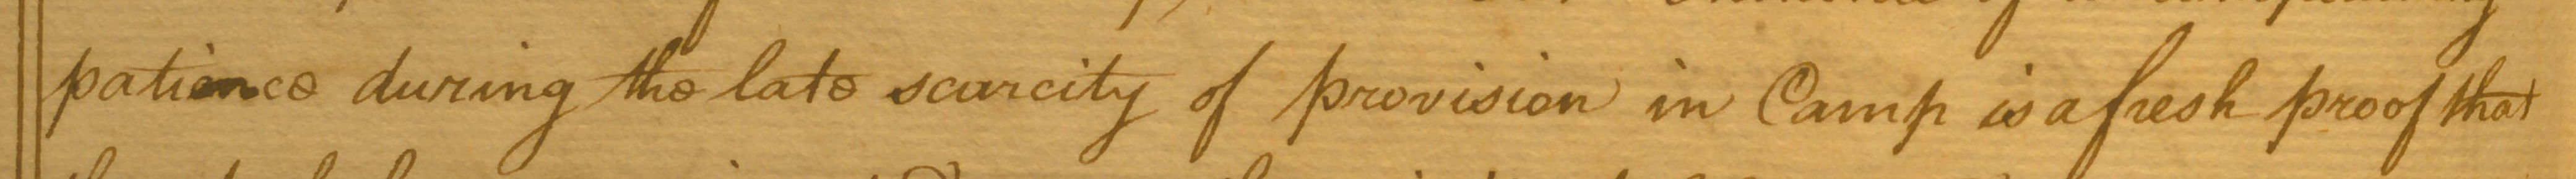patience during the late scarcity of provisions in Camp is a fresh proof that
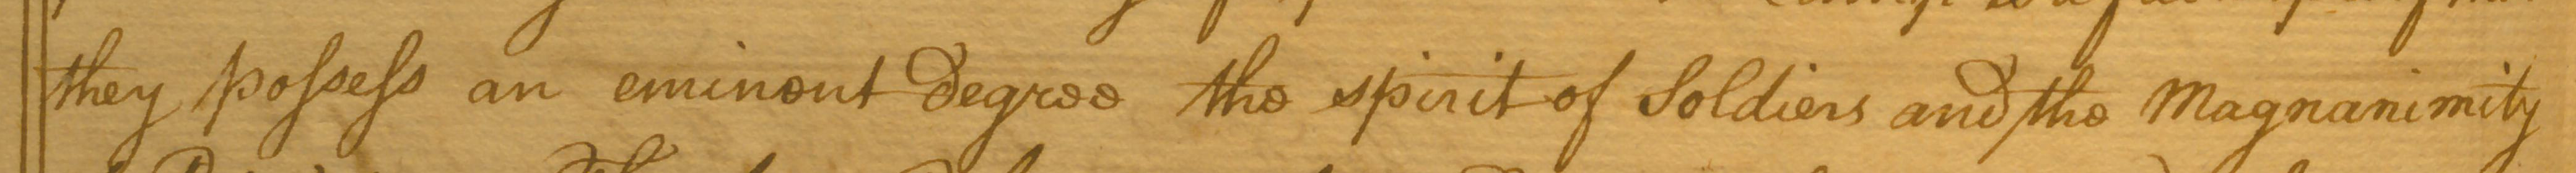they possess an eminent degree the spirit of Soldiers and the Magnanimity
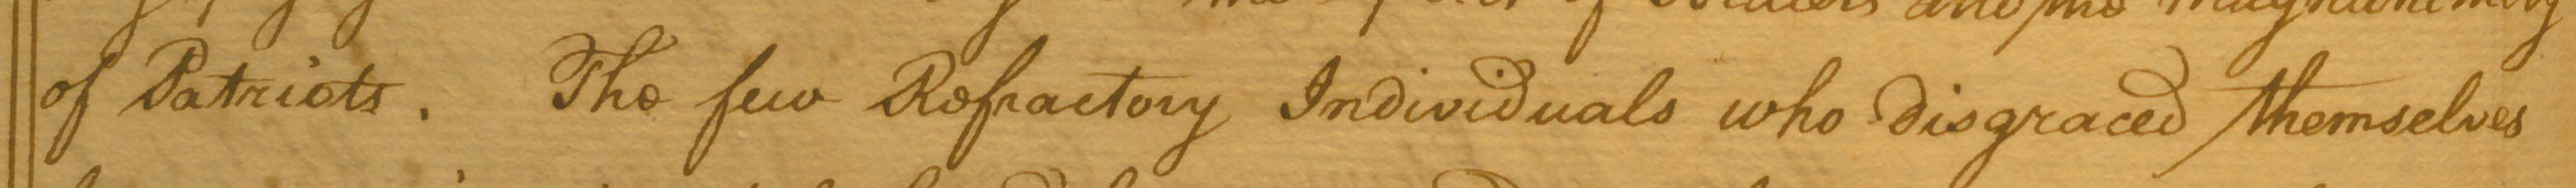of Patriots. The few Refractory Individuals who disgraced themselves
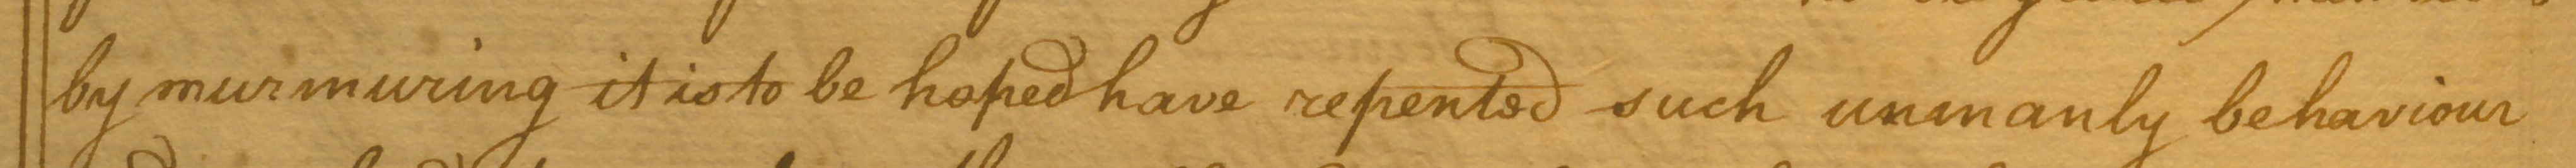by murmuring it is to be hoped have repented such unmanly behaviour
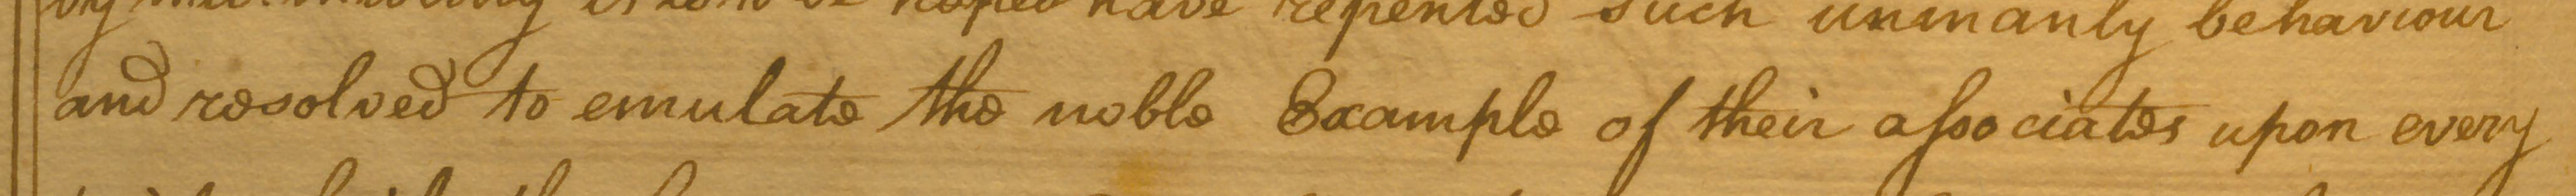and resolved to emulate the noble Example of their associates upon every
